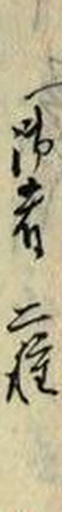御肴二種
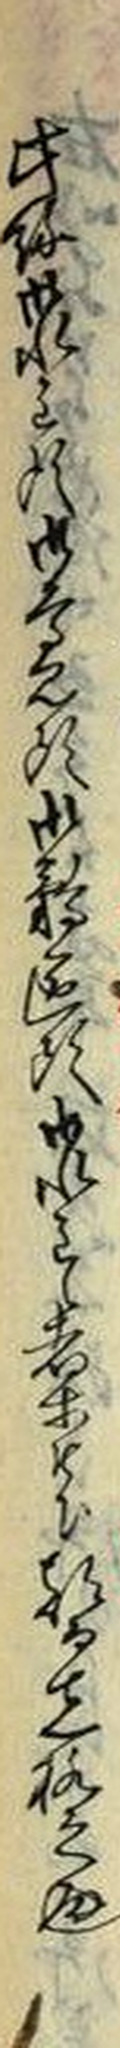此後御水主頭御鳥見頭御鵜匠頭御水主之者等被下都而先格之通
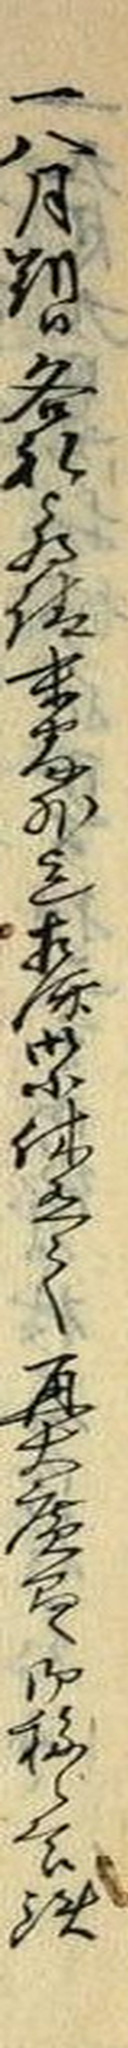一八月朔日各礼被為請末番外迄相済御小休有之再大広間へ御移之節鉄
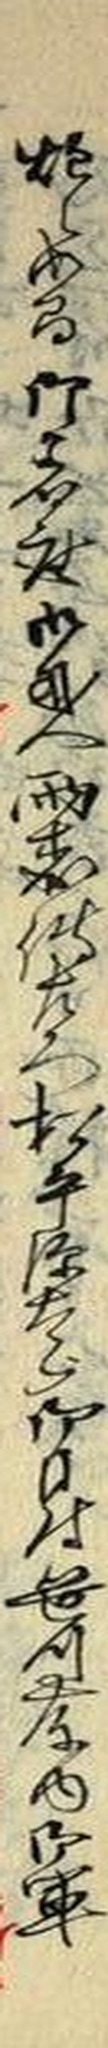炮之御間御着座御用人雨森伝左衛門松平源太郎御目付笹川藤内御軍
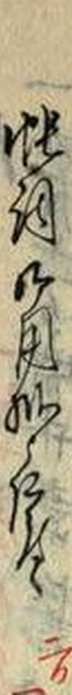帳調御用掛被仰付候
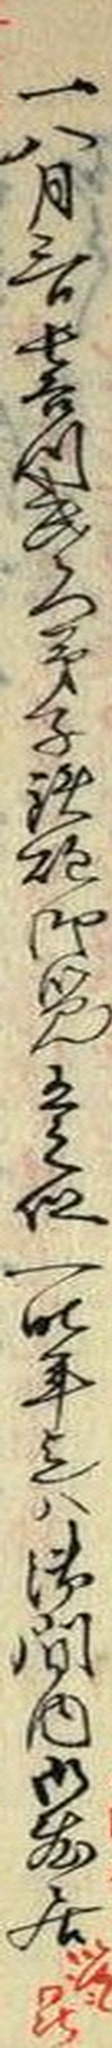一八月三日長谷川武右衛門弟子鉄炮御覧有之但一昨年迄ハ御間内御敷居
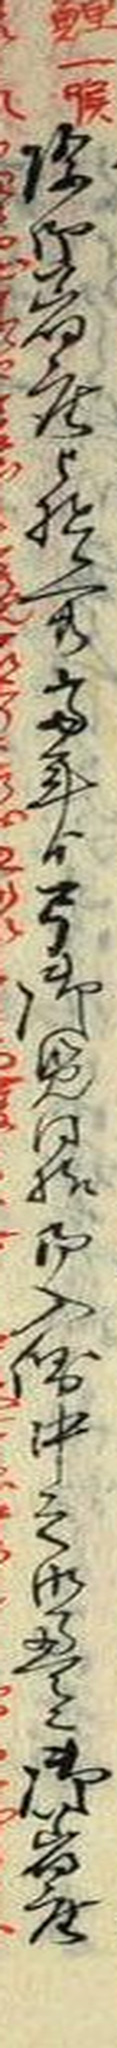際御着座被遊候へ共当年ゟ弓御覧同様御入側中之御畳ニ御着座
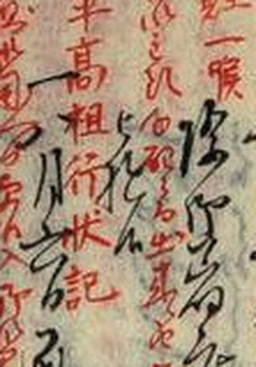被遊候
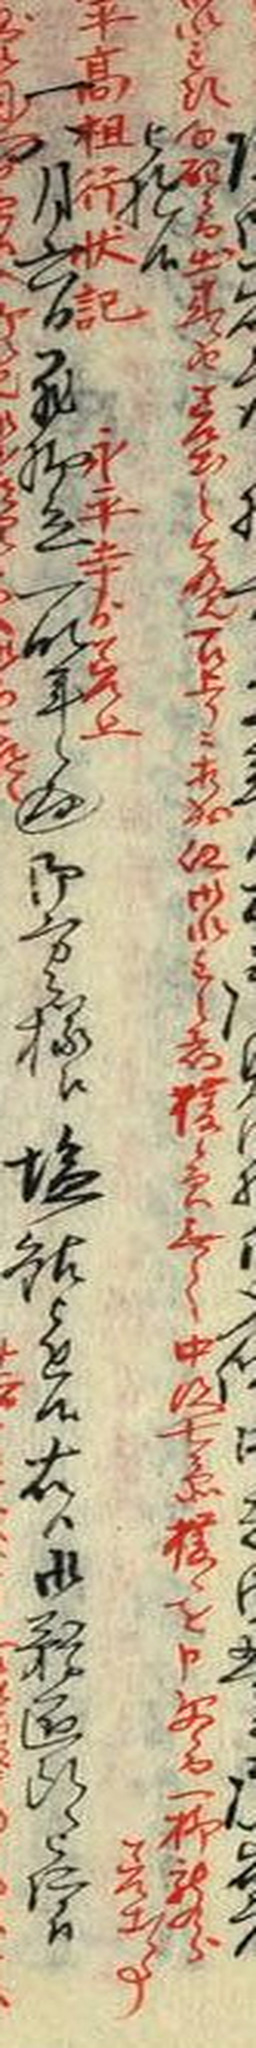一八月六日飛脚立一昨年之通御方々様江塩鮎被進候右ハ御鵜匠頭へ被仰付
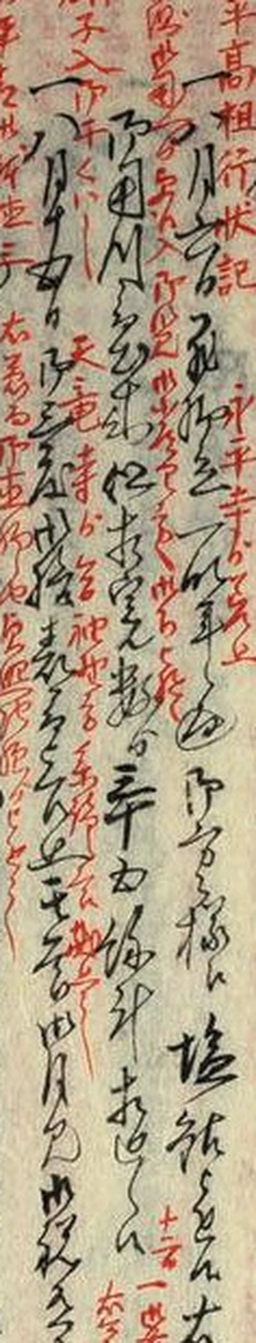御用川ニ而出来但相定ル数ゟ三十五余計相廻之候
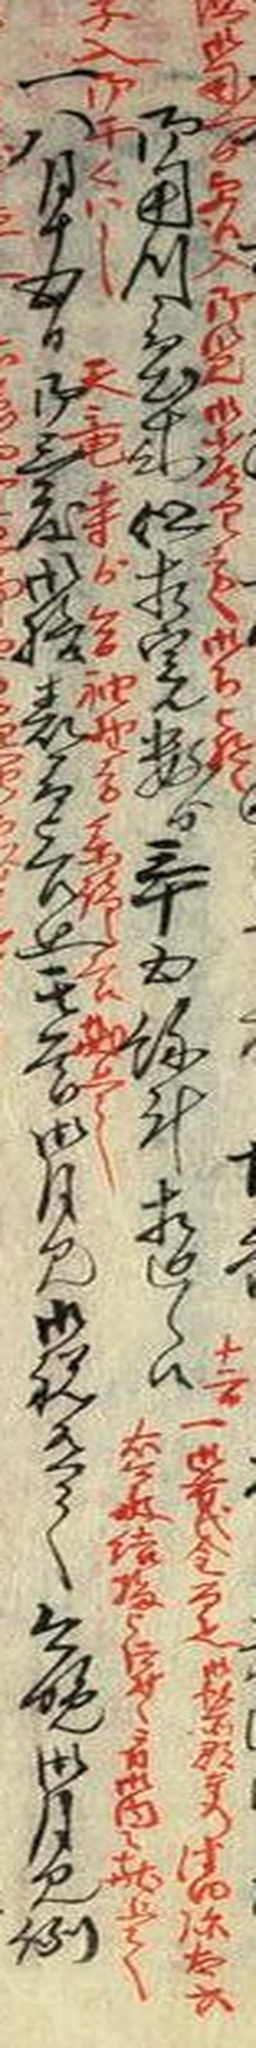一八月十五日御三度御膳表ニ而被召上其節御月見御祝有之今晩御月見例
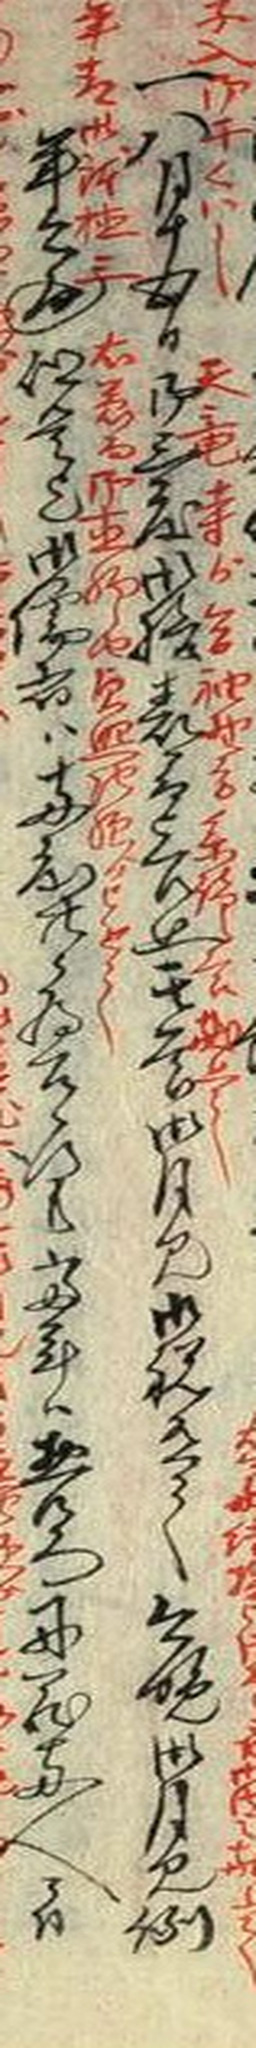年之通但是迄御儒者ハ両度共被為召候得共当年ハ惣左衛門丹蔵両人ニ付
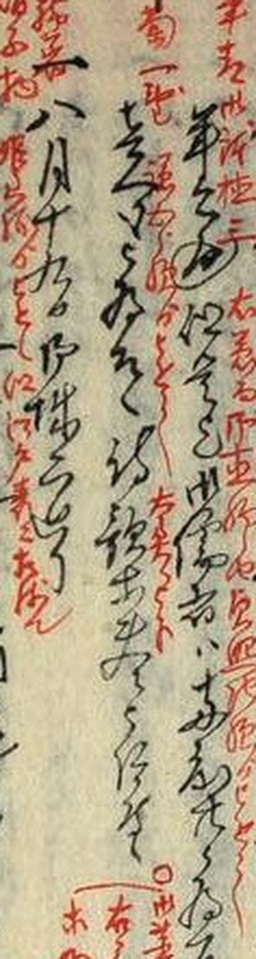壱人ツヽ被為召候詩歌等夫々被仰付候
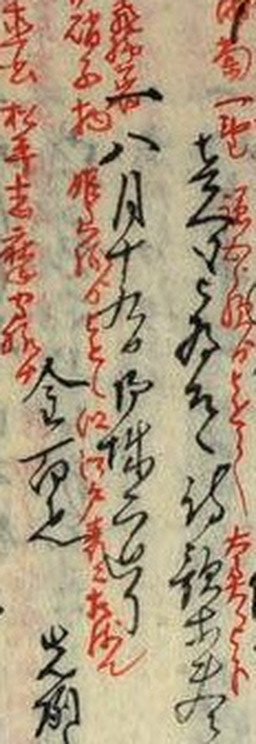一八月十九日御城下廻り
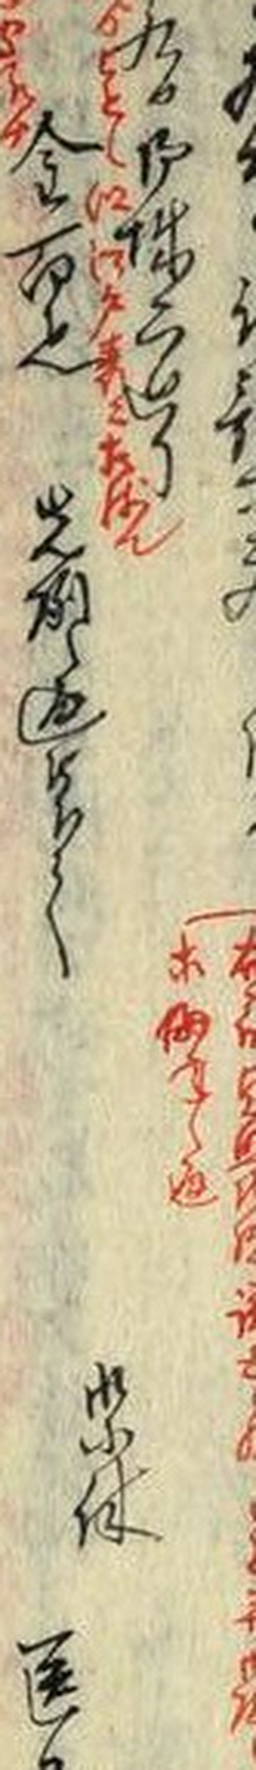金百疋先例之通被下之御小休医王寺
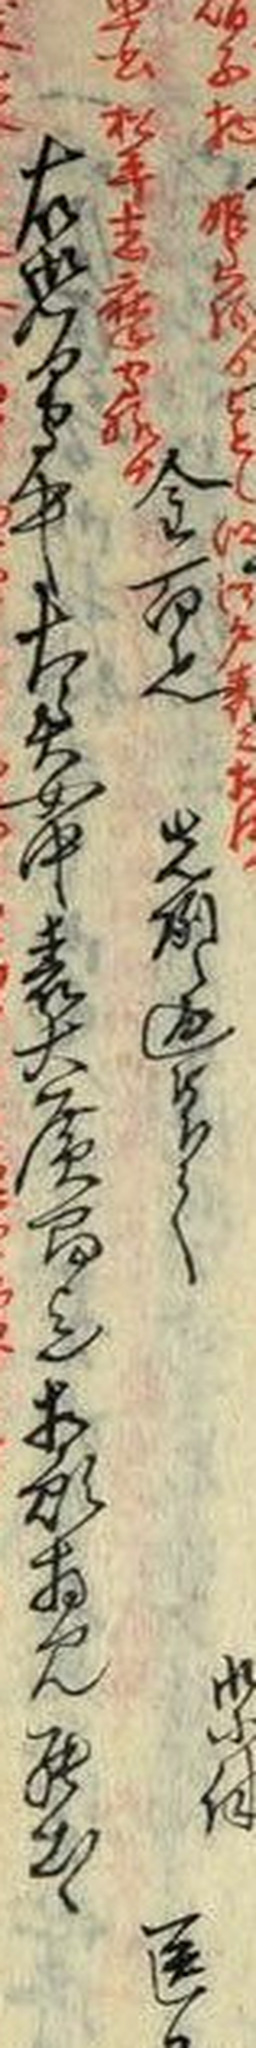右御留守中大奥女中表大広間迄相願拝見罷出候
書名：少傅日録抄（斉承付側向頭取日記、在国）
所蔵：福井県文書館 Fukui Prefectural Archives
